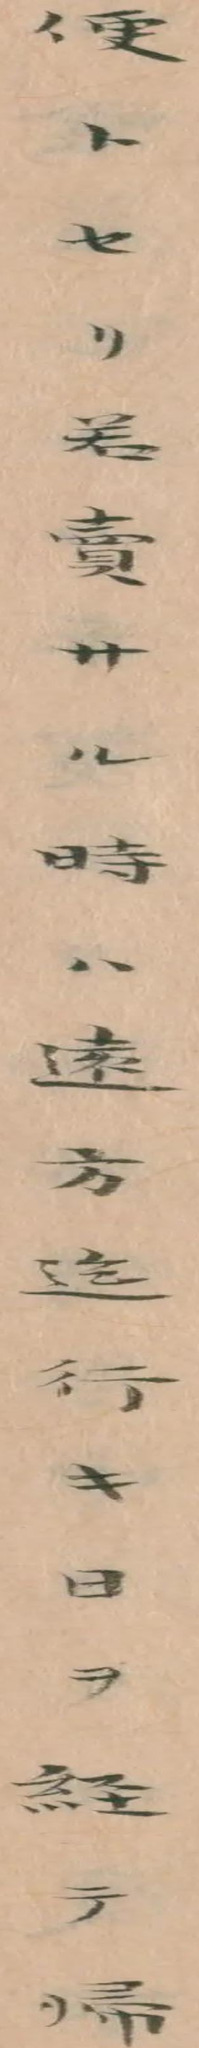便トセリ若売サル時ハ遠方迄行キ日ヲ経て帰
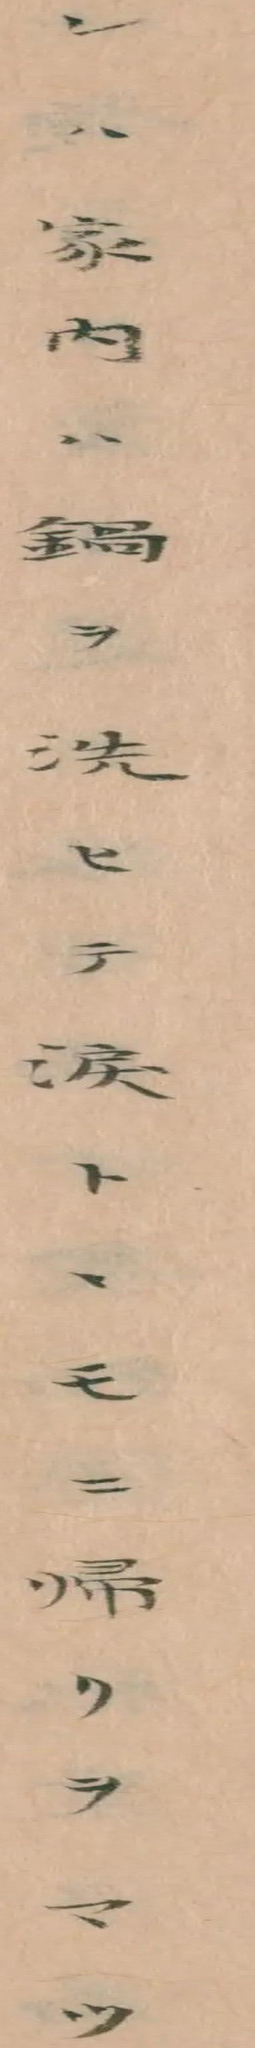シハ家内ハ鍋ヲ洗ヒテ涙トゝモ二帰りヲマツ
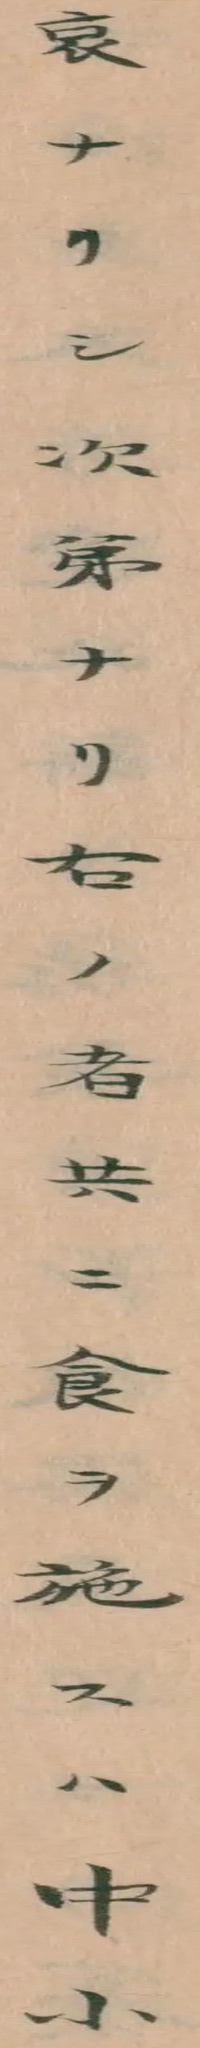哀ナリシ次第ナリ右ノ者共二食ヲ施スハ中小
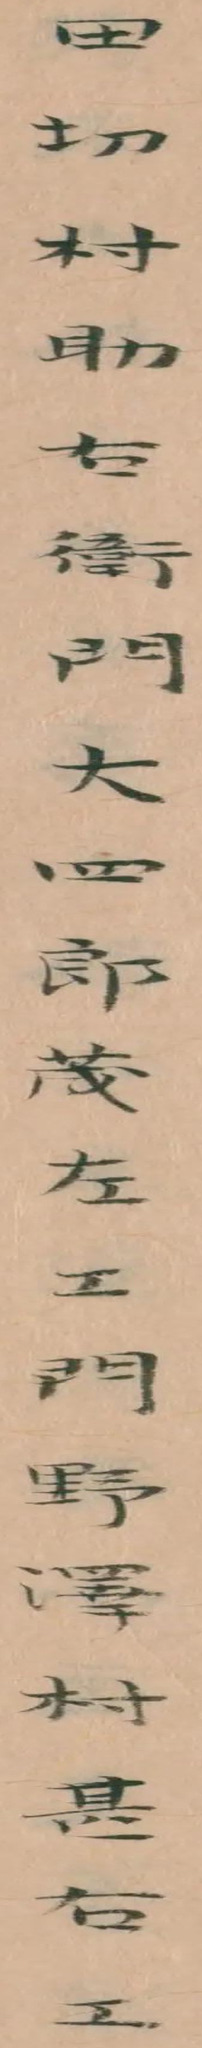田切村助右衛門大四郎茂左衛門野沢村甚右衛
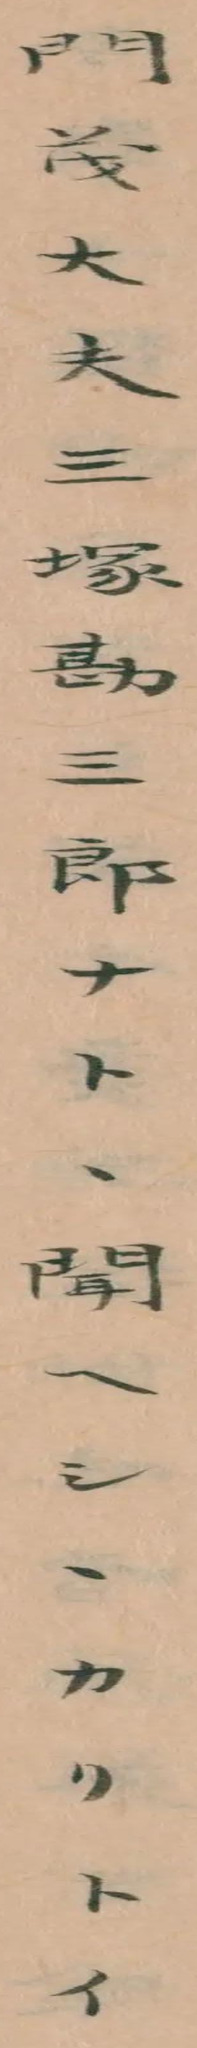門茂太夫三塚勘三郎ナトゝ聞へシゝカリトイ
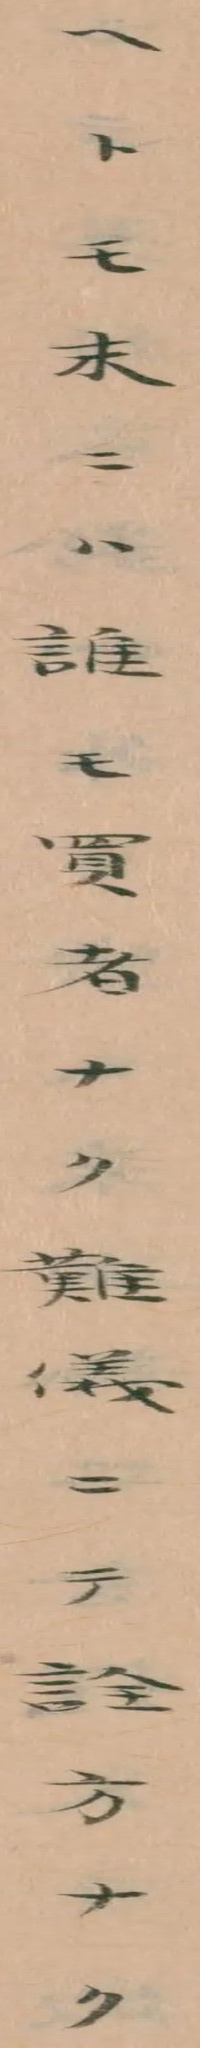へトモ未ニハ誰モ買者ナク難儀ニテ詮方ナク
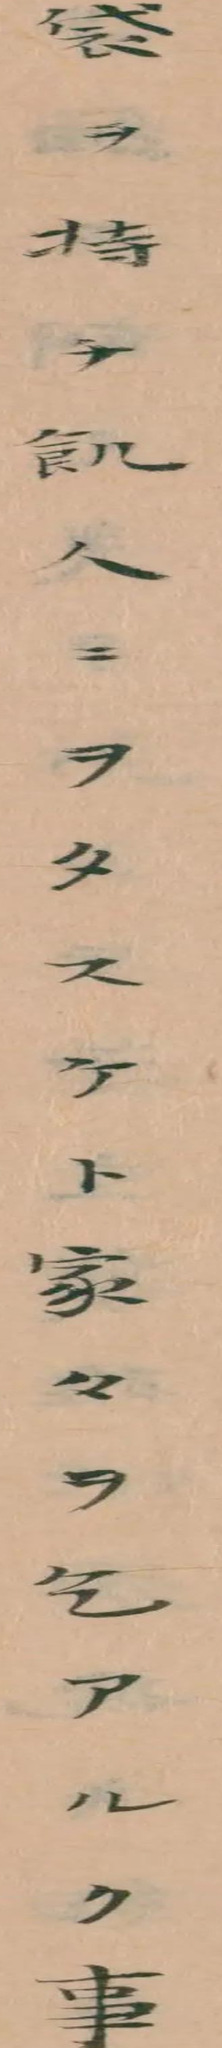袋ヲ持チ飢人二ヲタスケト家々ヲ乞アルク事
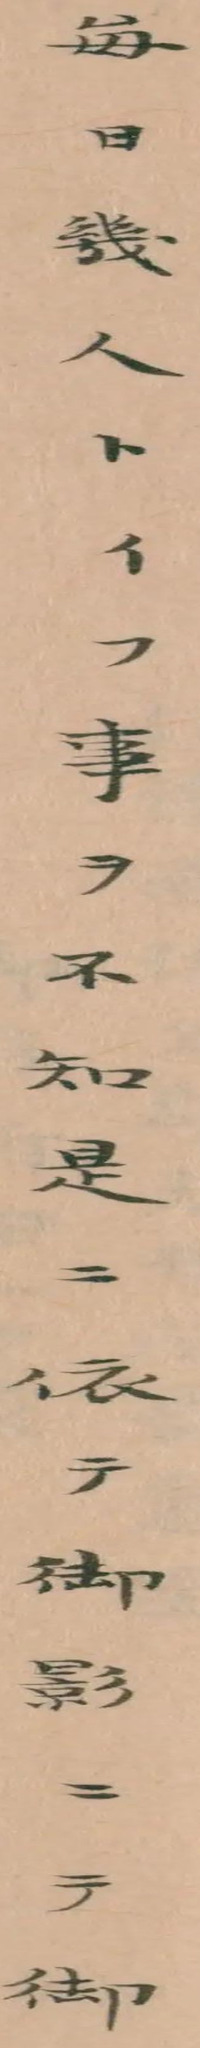毎日幾人トイフ事ヲ不知是二依テ御影ニテ御
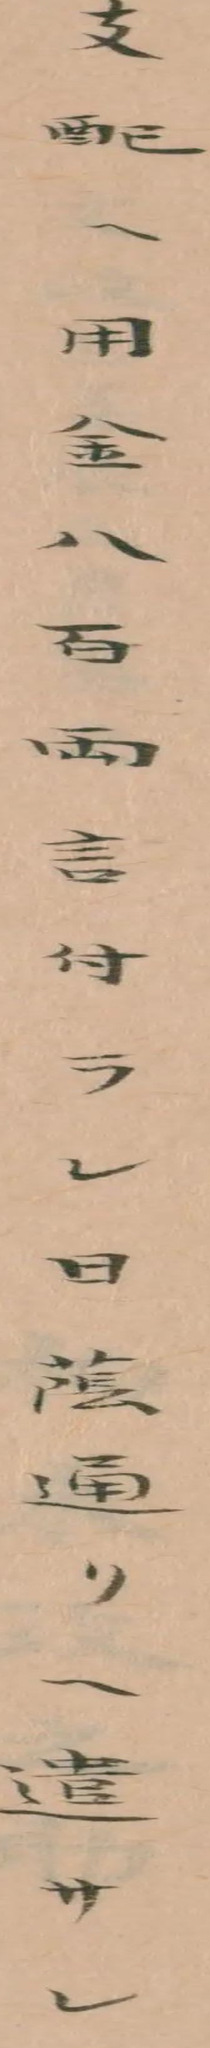支配ヘ用金八百両言付ラレ日蔭通リヘ遣サレ
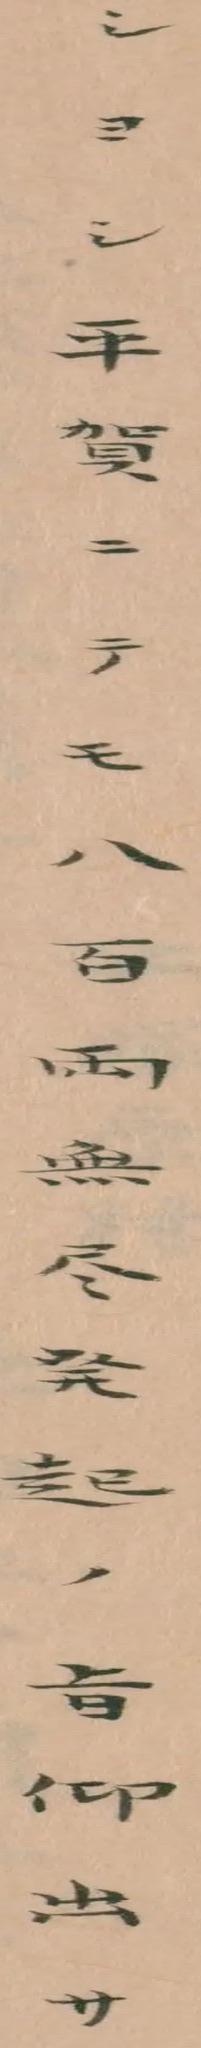シヨシ平賀ニテモ八百両無尽発起ノ旨仰出サ
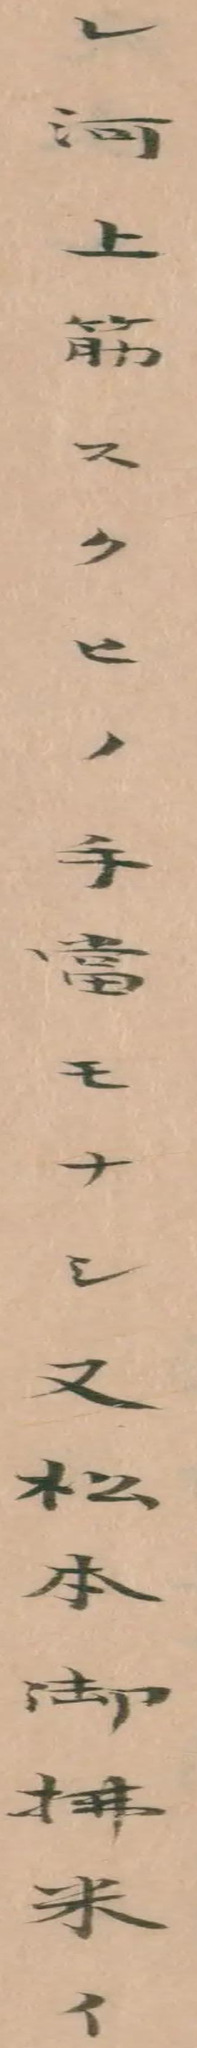レ河上筋スクヒノ手当モナシ又松本御払米イ
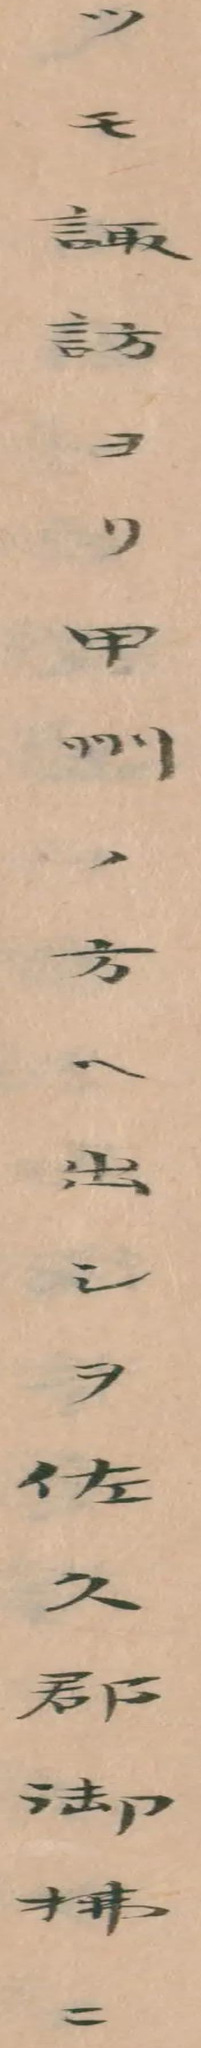ッモ諏訪ヨリ甲州ノ方ヘ出シヲ佐久郡御払二
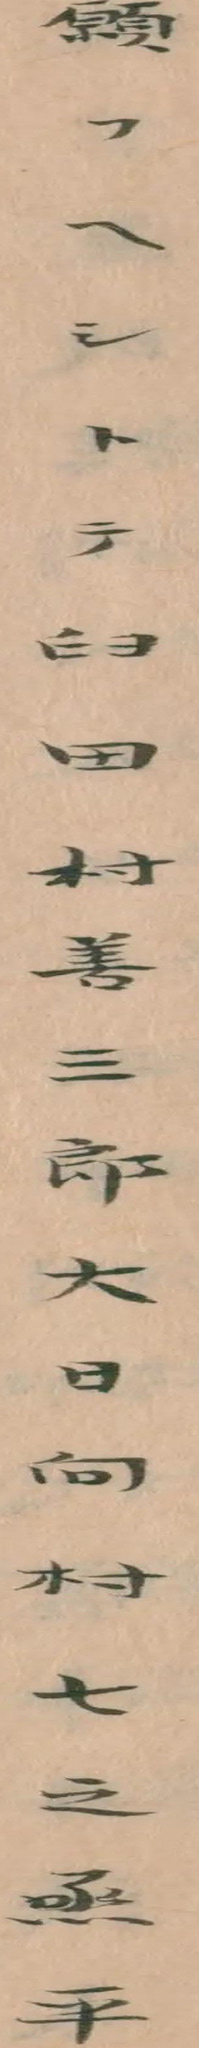願フへシトテ臼田村善三郎大日向村七之丞平
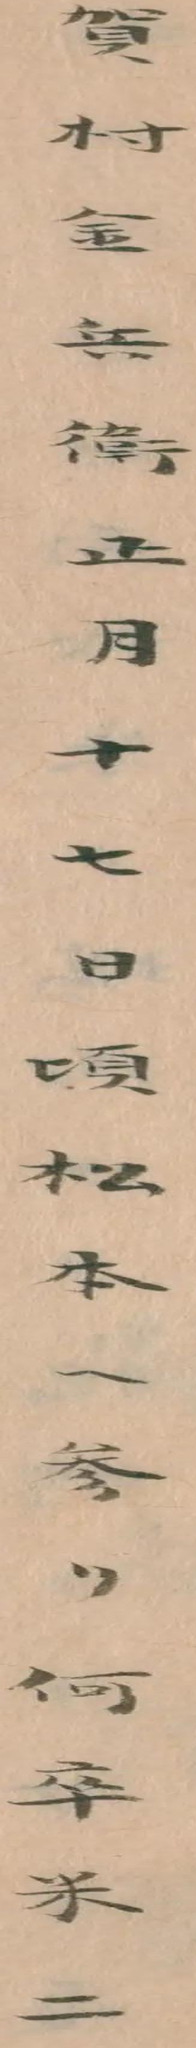賀村金兵衛正月十七日頃松本へ参り何卒米二
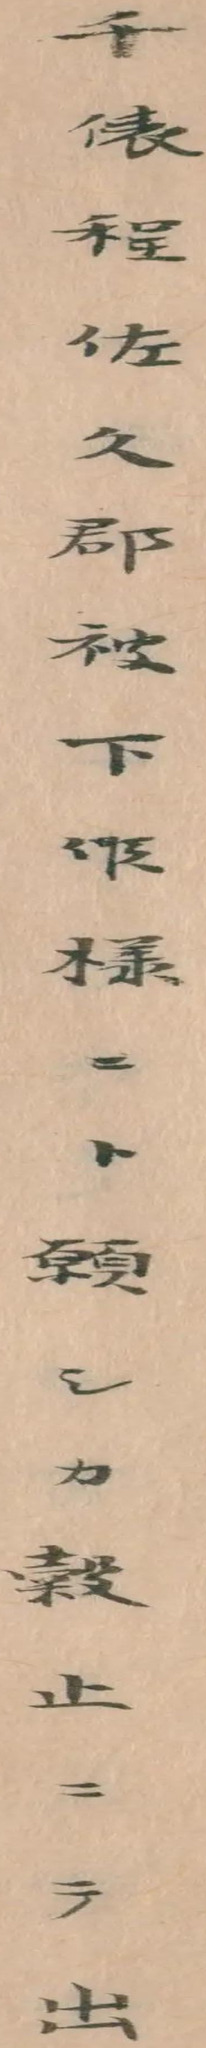千俵程佐久郡被下候様ニト願シカ穀止ニテ出
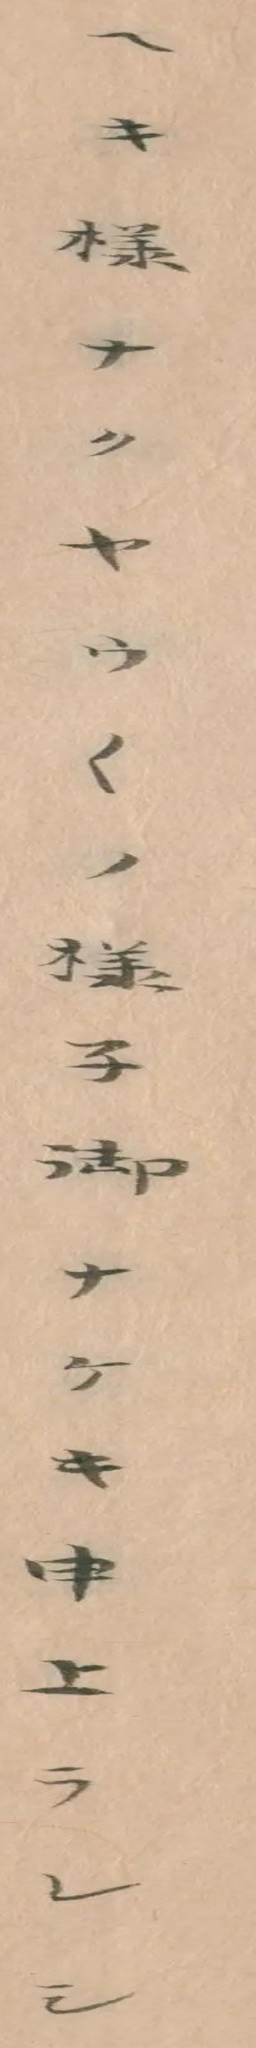ヘキ様ナクヤウ〳〵ノ様子御ナケキ申上ラレシ
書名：地災撮要. 巻3(地震之部)-巻4(噴火之部)
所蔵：国立国会図書館 National Diet Library, JAPAN
